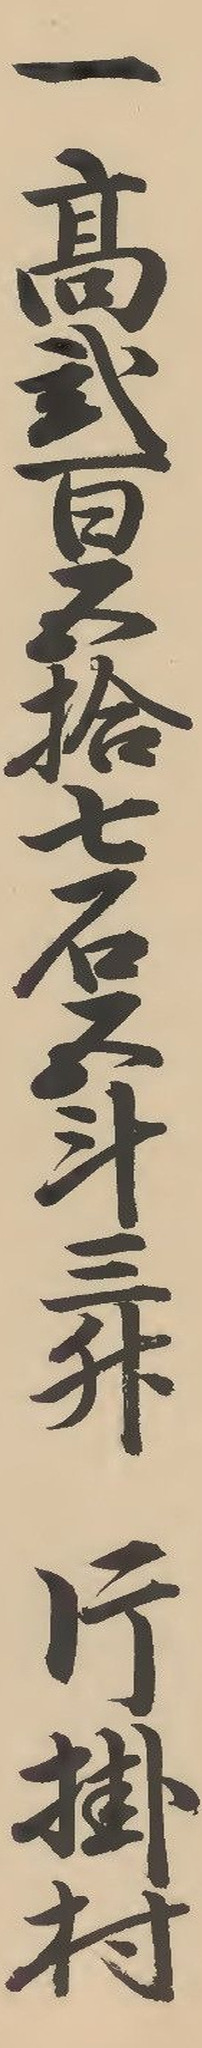一高弐百五拾七石五斗三升片掛村
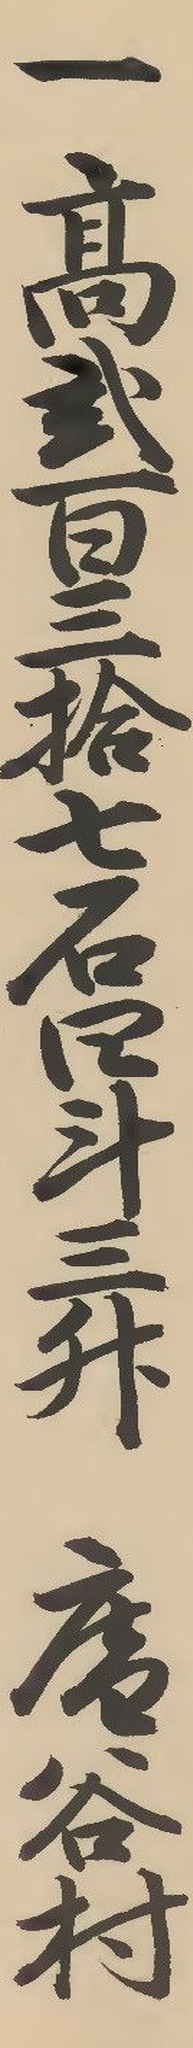一高弐百三拾七石四斗三升庵谷村
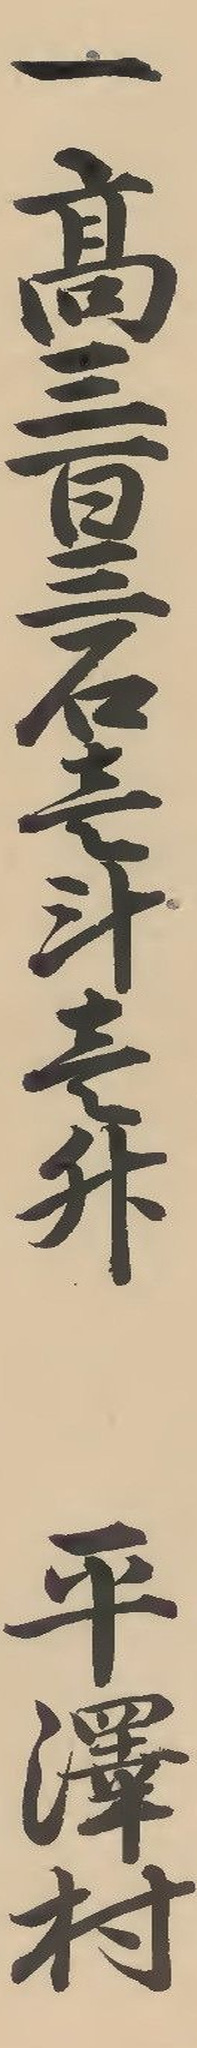一高三百三石壱斗壱升平沢村

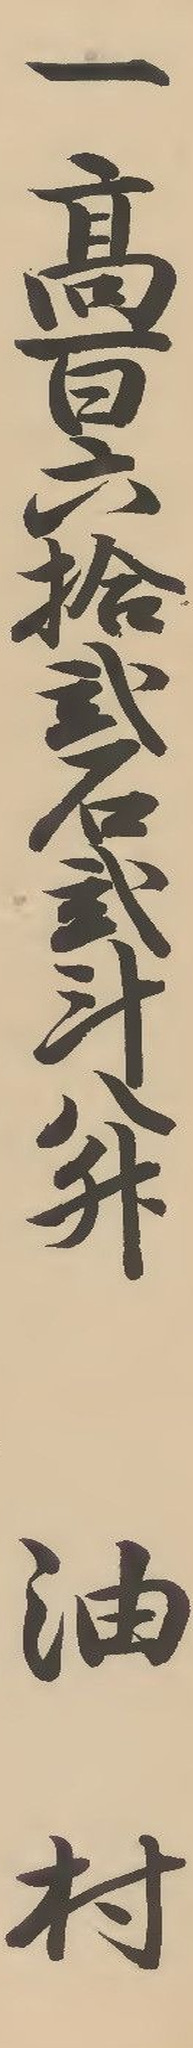一高百六拾弐石弐斗八升油村
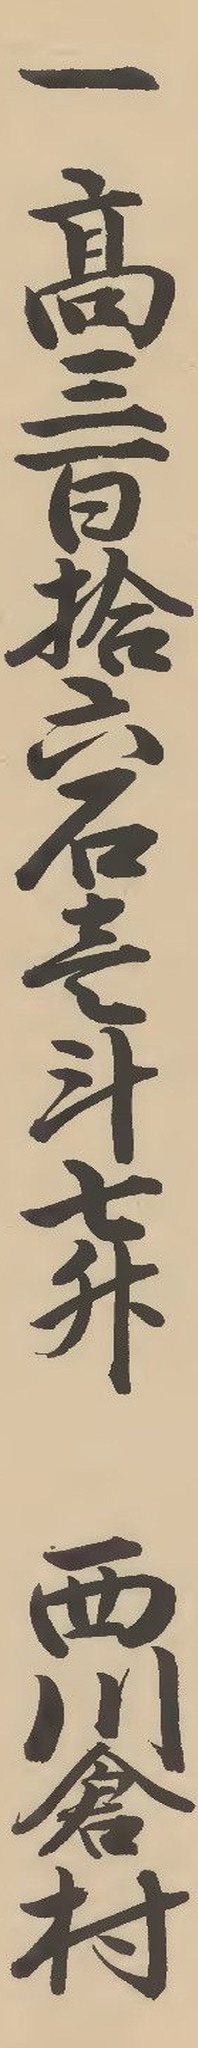一高三百拾六石壱斗七升西川倉村
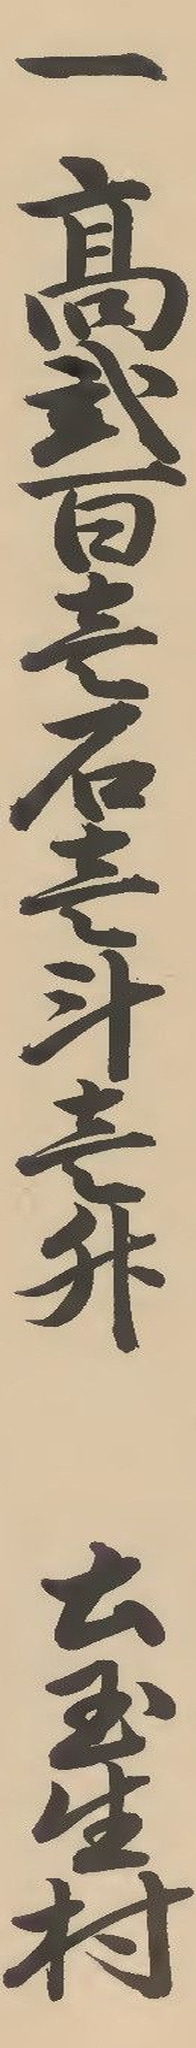一高弐百壱石壱斗壱升土玉生村
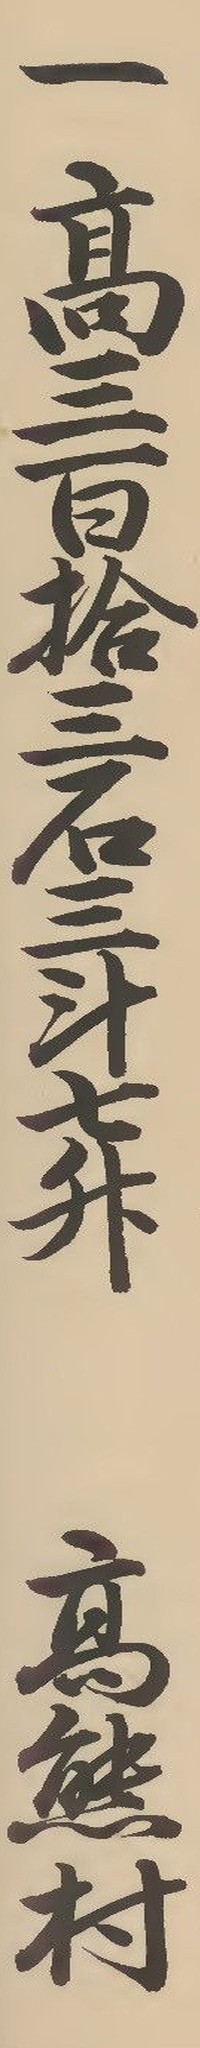一高三百拾三石三斗七升高熊村
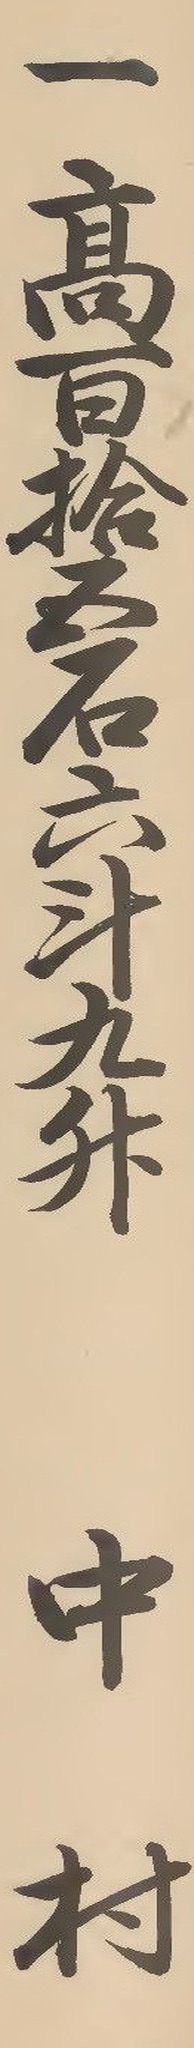一高百拾五石六斗九升中村
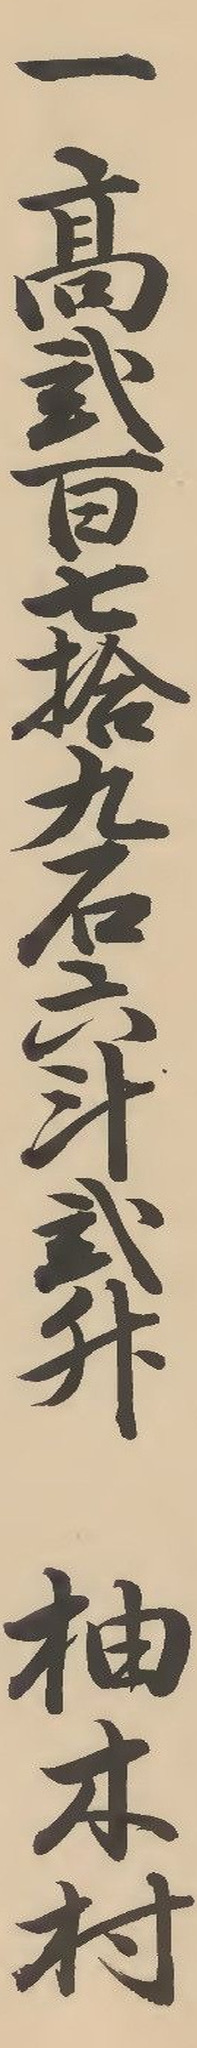一高弐百七拾九石六斗弐升柚木村
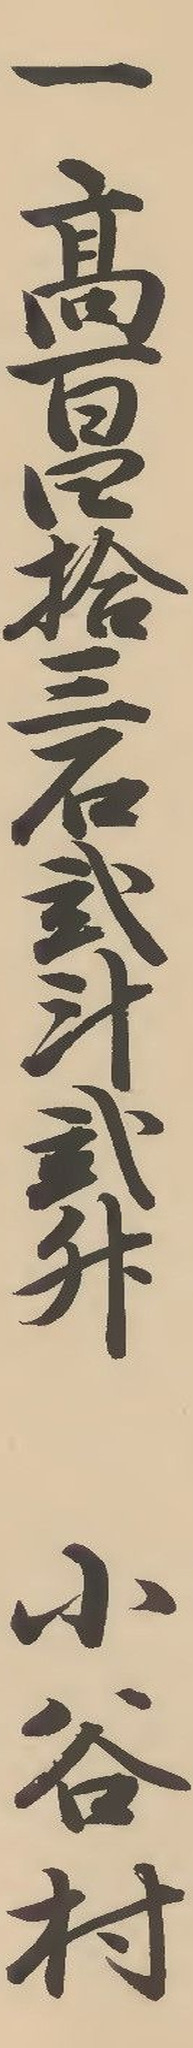一高百四拾三石弐斗弐升小谷村
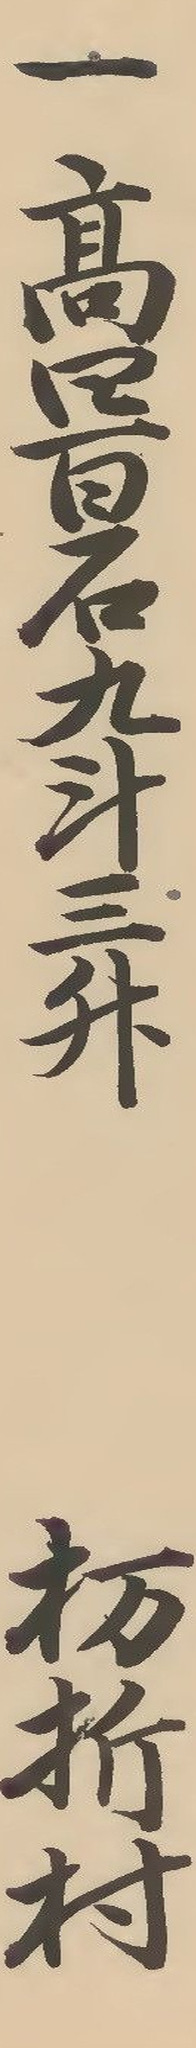一高四百石九斗三升栃折村

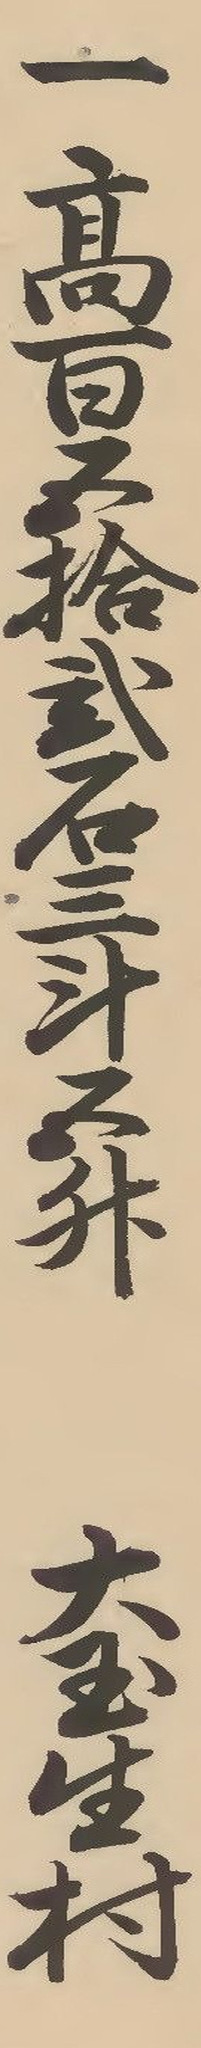一高百五拾弐石三斗五升大玉生村
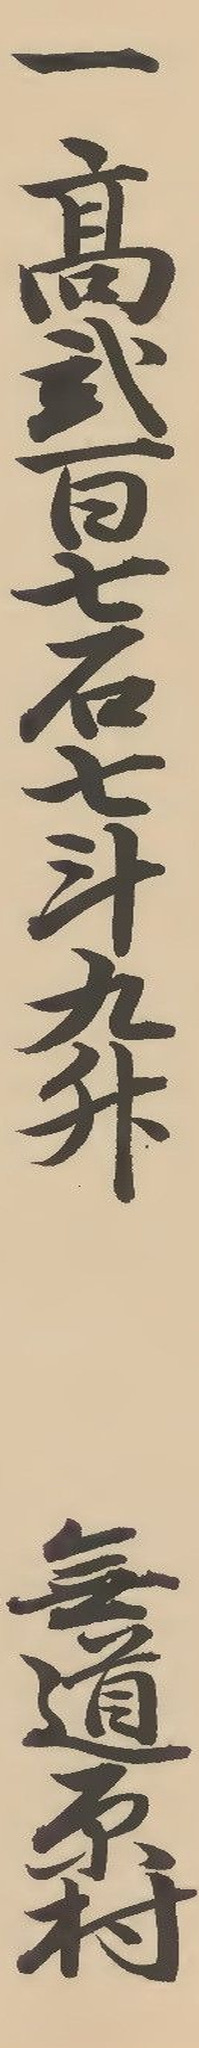一高弐百七石七斗九升無道原村
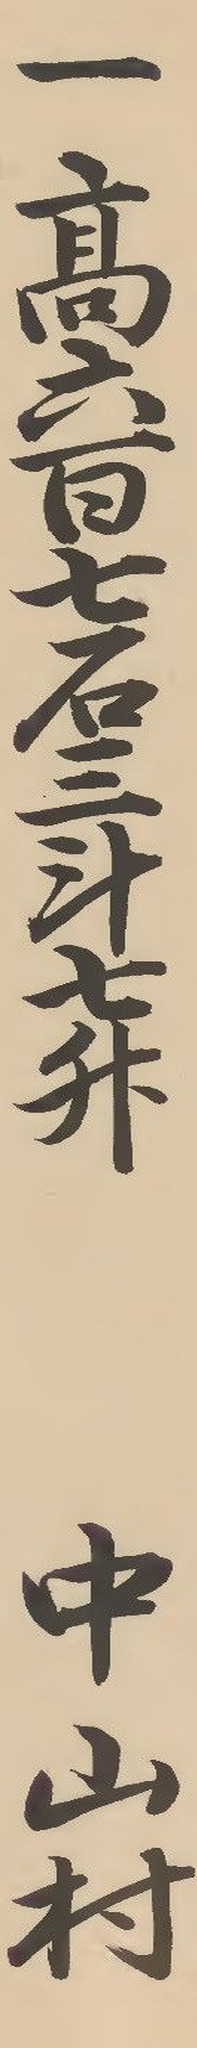一高六百七石三斗七升中山村
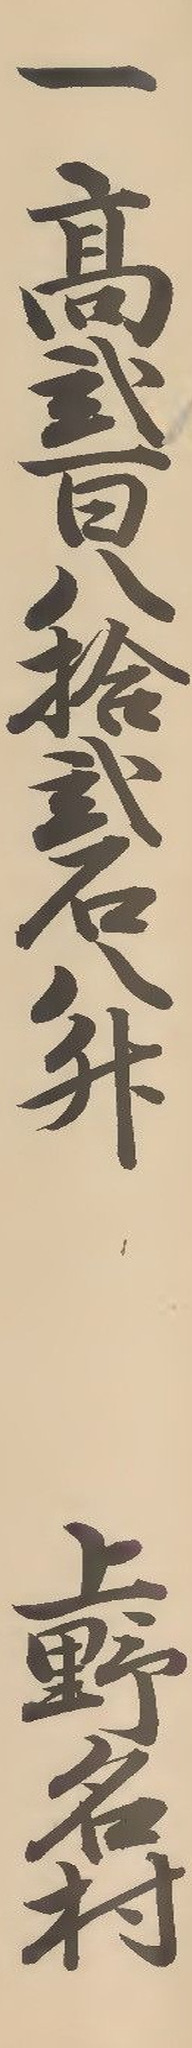一高弐百八拾弐石八升上野名村
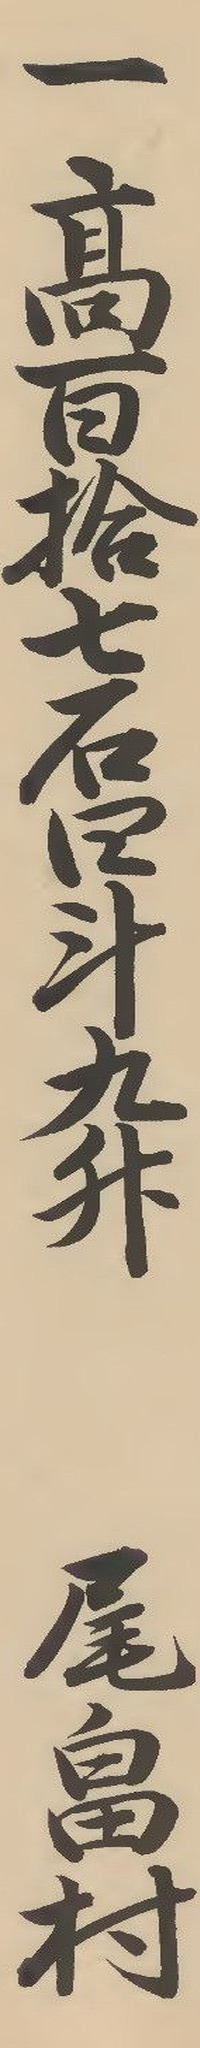一高百拾七石四斗九升尾畠村
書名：越中国郷帳
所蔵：国立公文書館 National Archives of Japan
